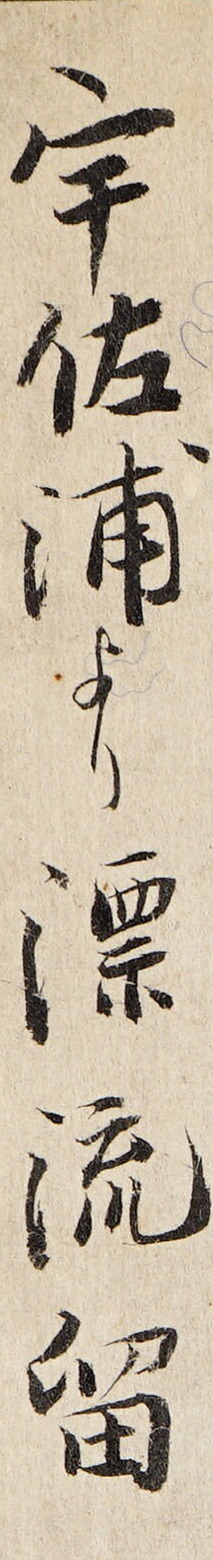宇佐浦より漂流留

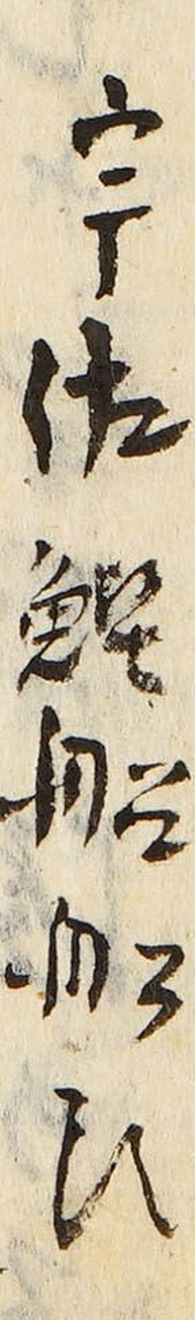宇佐鰹船船頭
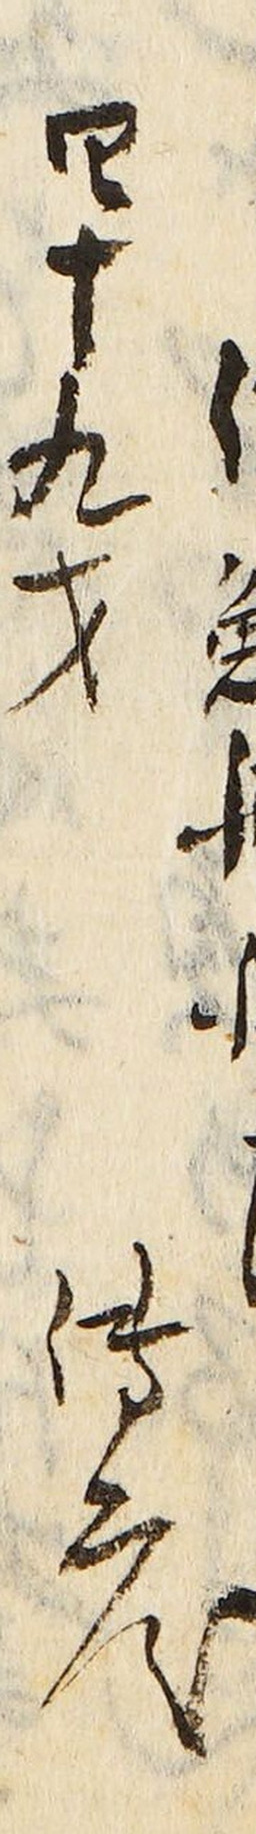四十九才伝蔵
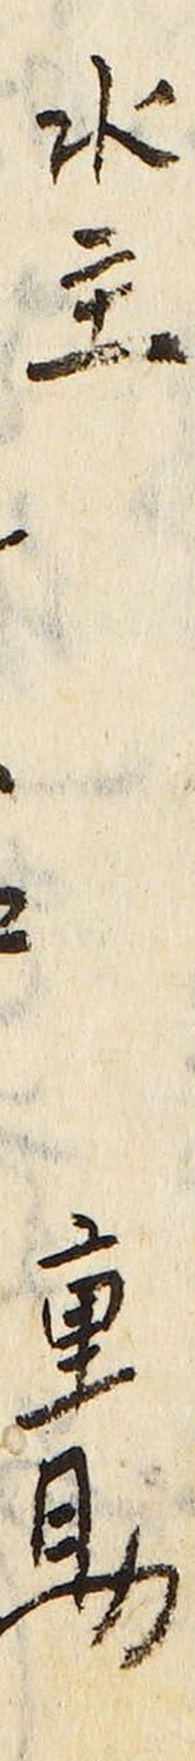水主重助
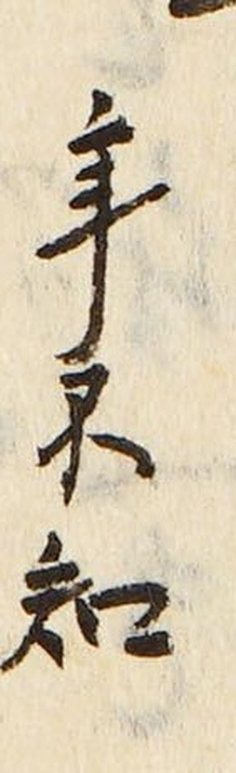年不知
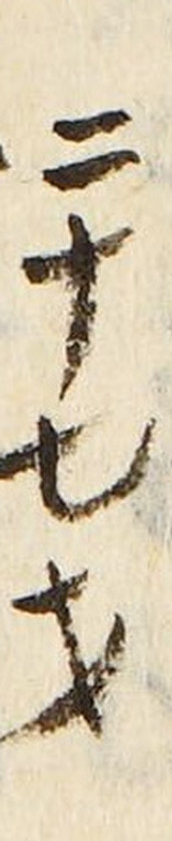二十七才
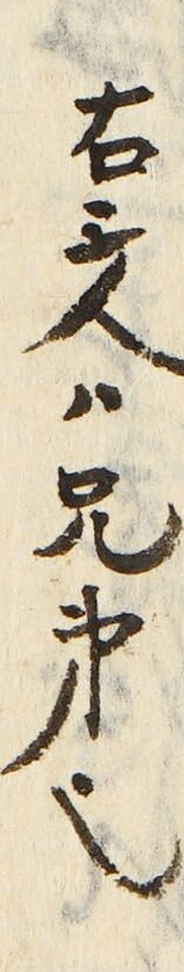右三人は兄弟也
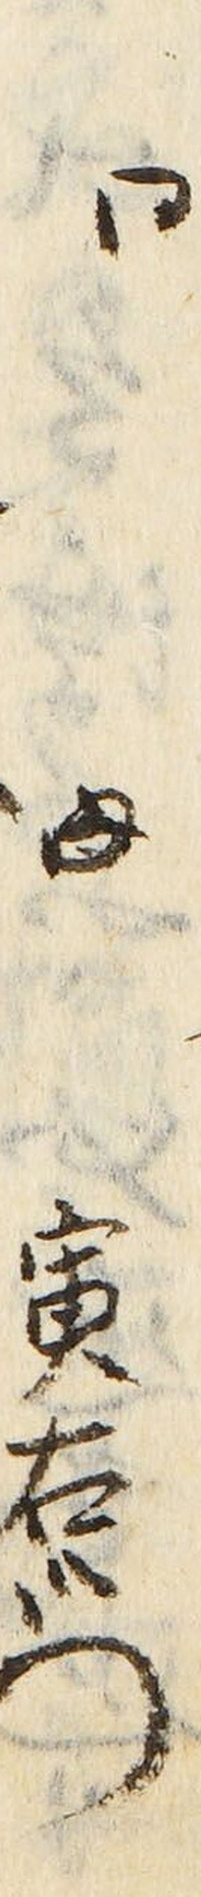同寅右衛門
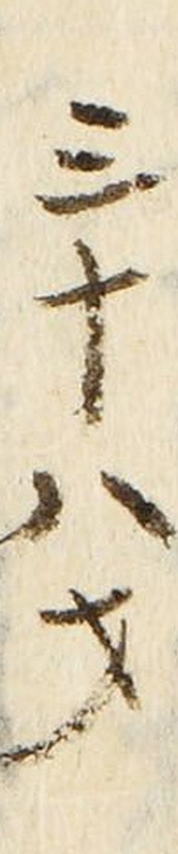三十八才
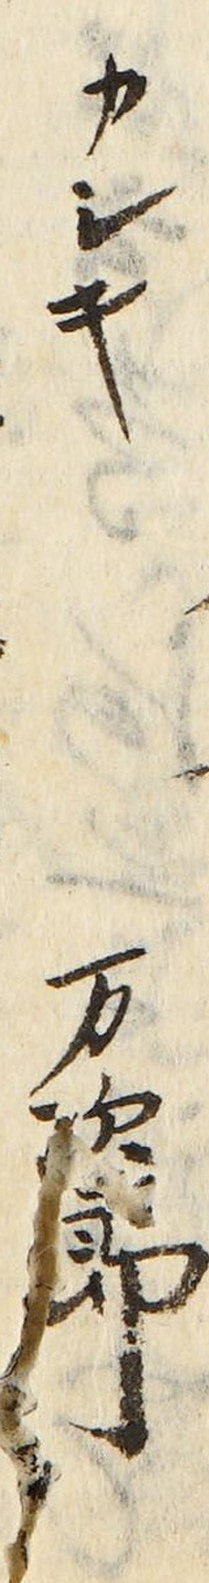カシキ万次郎
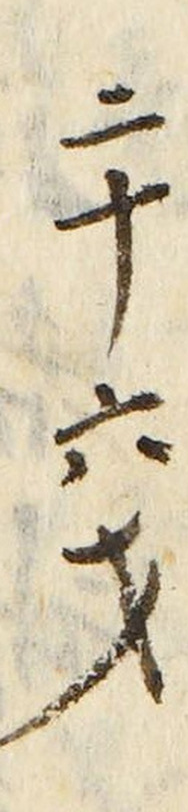二十六才
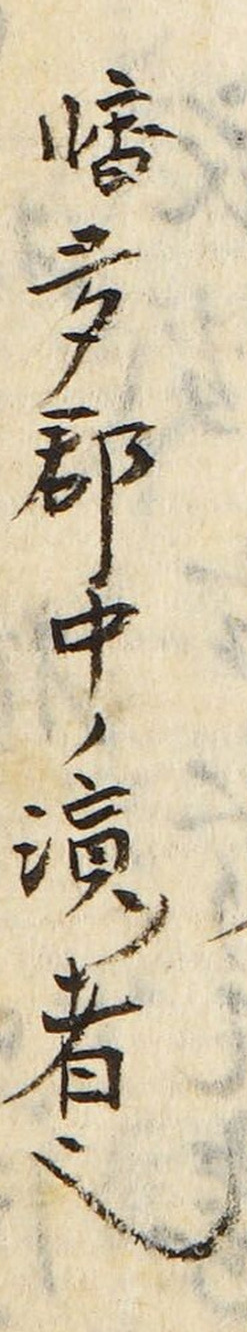幡多郡中ノ浜ノ者也
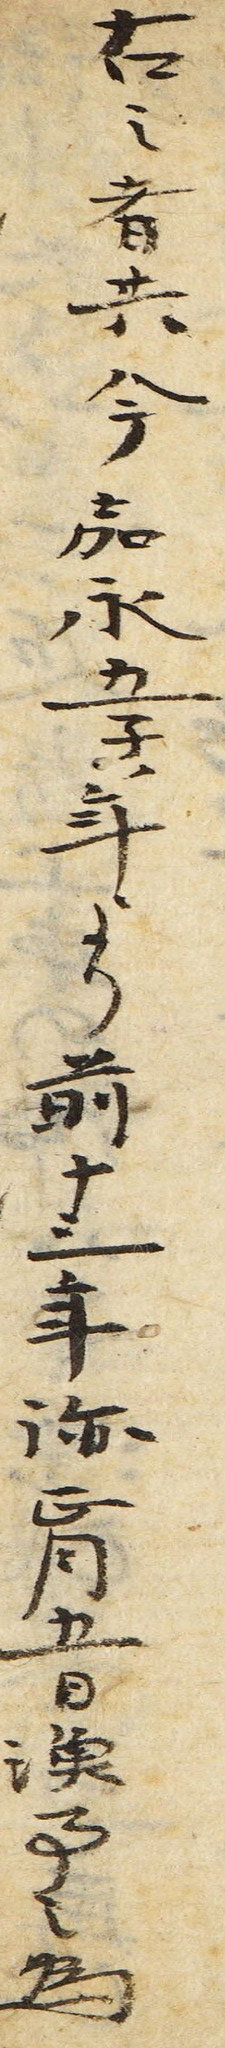右之者共今嘉永五子ノ年より前十三年跡正月五日漁事之為
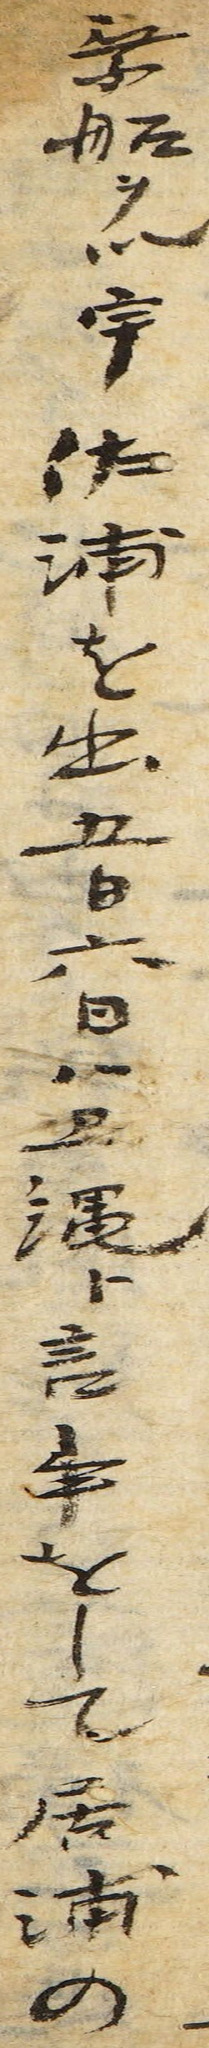乗船を以宇佐浦を出五日六日ハヱ縄と言事をして居浦の

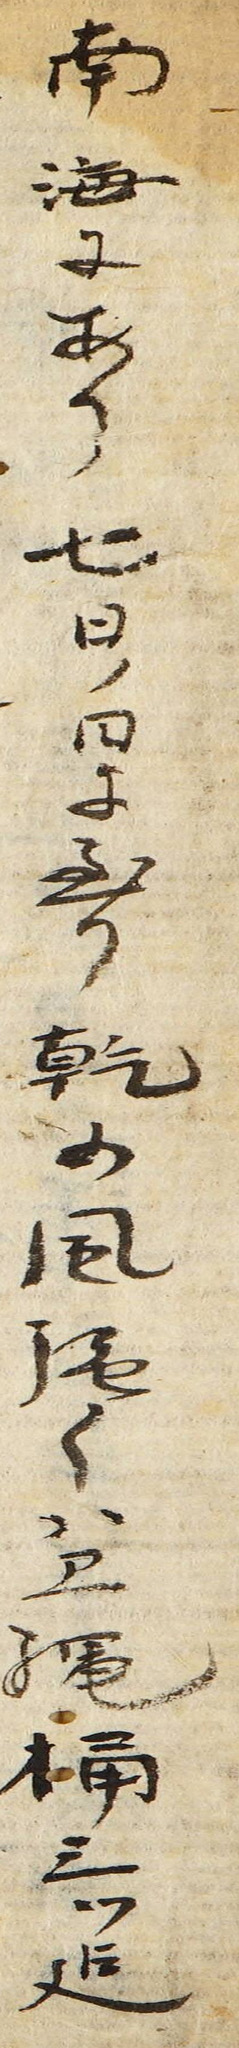南海にあり七日の日に至り乾の風強くハヱ縄桶三ツ迄
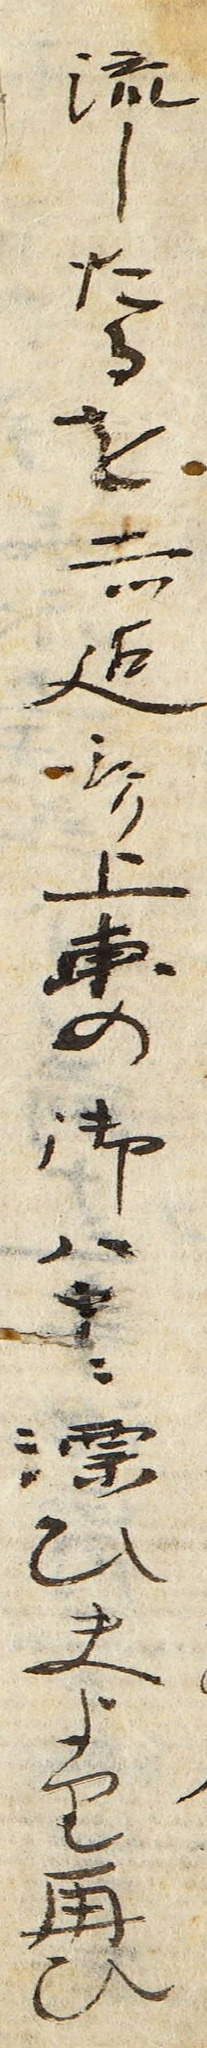流したるを二ツ返えり上東の御ハに漂ひ夫より再ひ
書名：宇佐浦より漂流留
